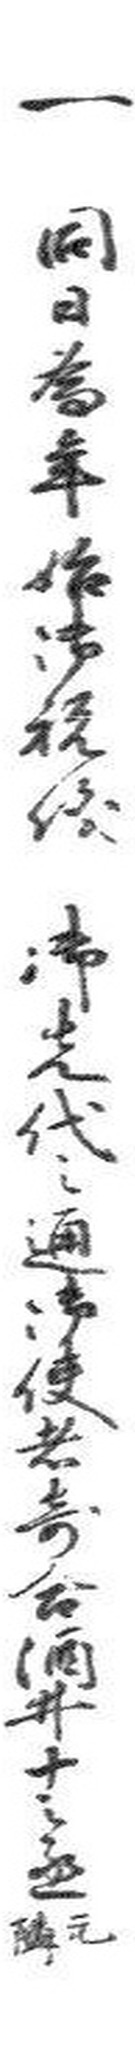一同日為年始御祝儀御先代之通御使者寄合酒井十之丞元隣
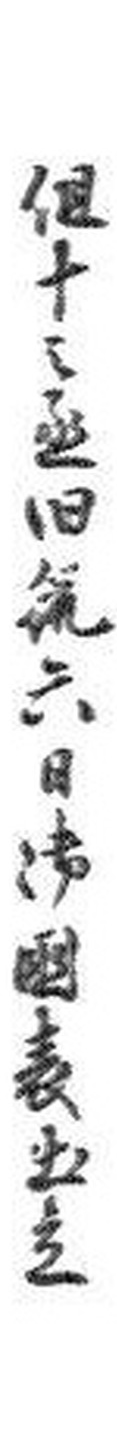但十之丞旧臘六日御国表出立
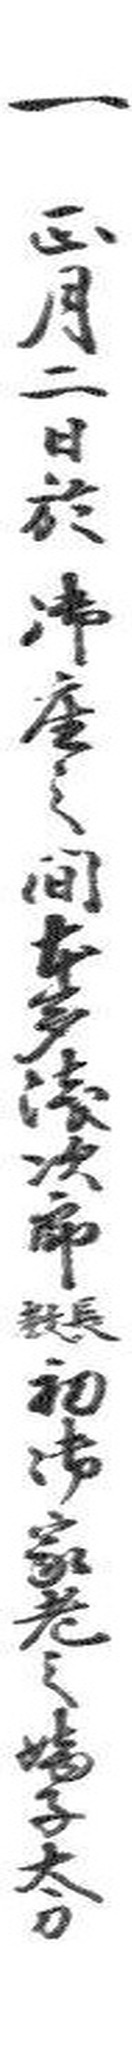一正月二日於御座之間本多浅次郎長教初御家老之嫡子太刀
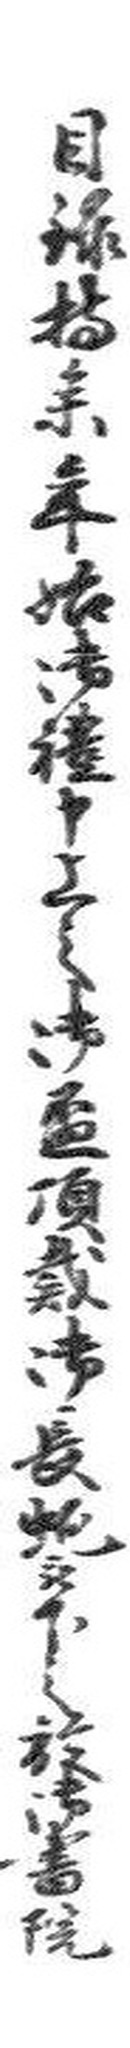目録持参年始御礼申上之御盃頂戴御長蚫被下之於御書院
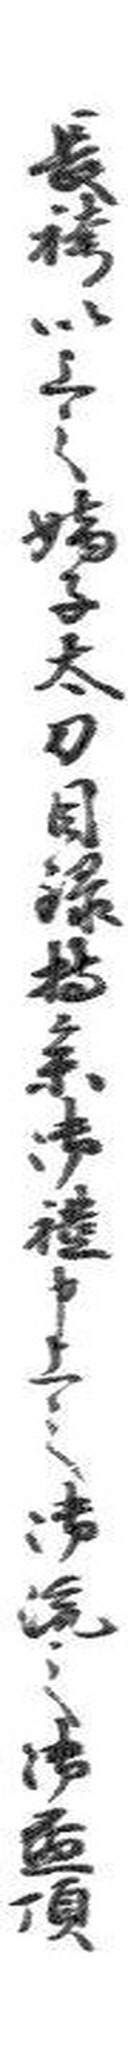長袴以上之嫡子太刀目録持参御礼申上之御流之御盃頂
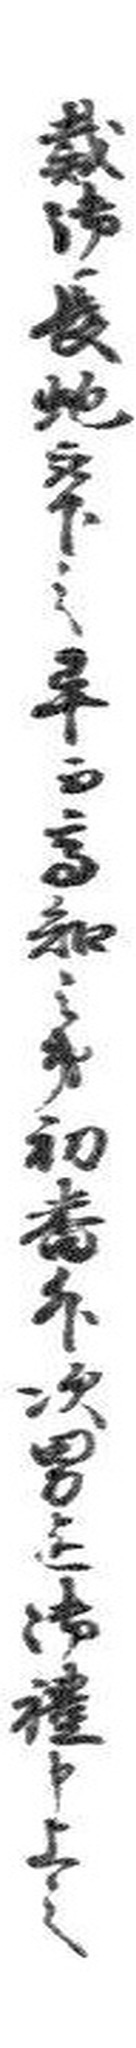戴御長蚫被下之畢而高知之弟初番外次男迄御礼申上之
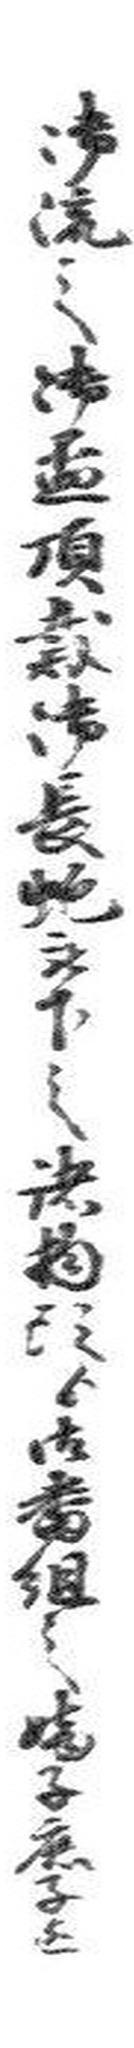御流之御盃頂戴御長蚫被下之諸物頭ゟ御番組之嫡子庶子迄
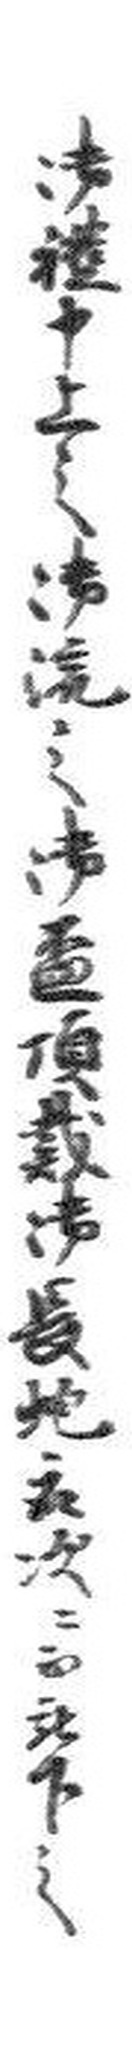御礼申上之御流之御盃頂戴御長蚫取次ニ而被下之
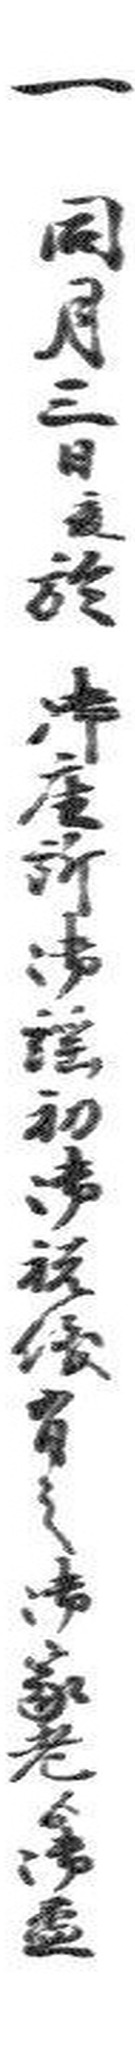同月三日夜於御座所御謡初御祝儀有之御家老ゟ御盃

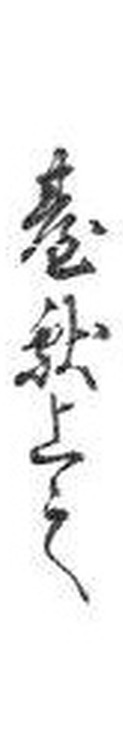台献上之
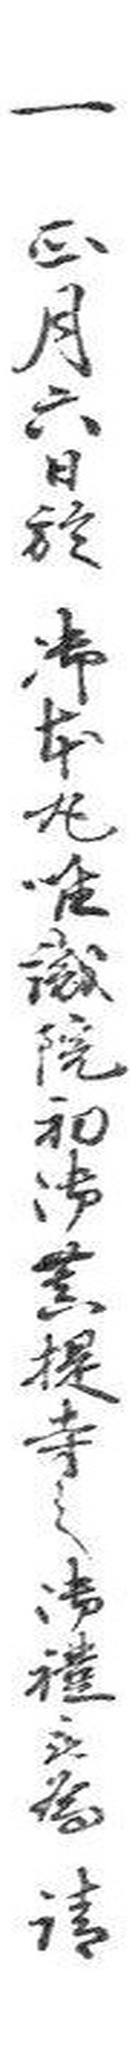一正月六日於御本丸唯識院初御菩提寺之御礼被為請
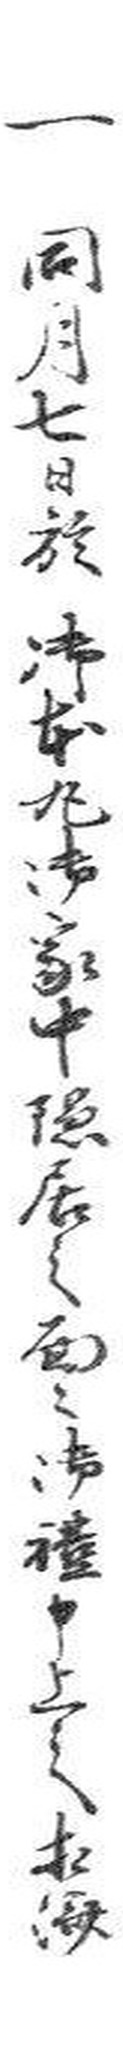一同月七日於御本丸御家中隠居之面々御礼申上之相済
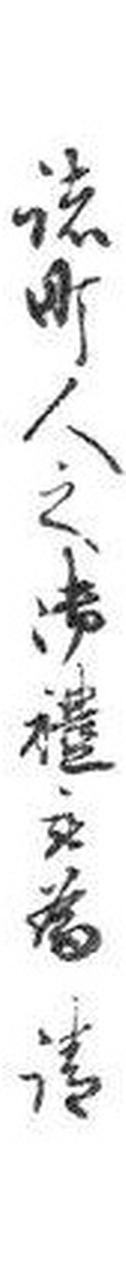諸町人之御礼被為請
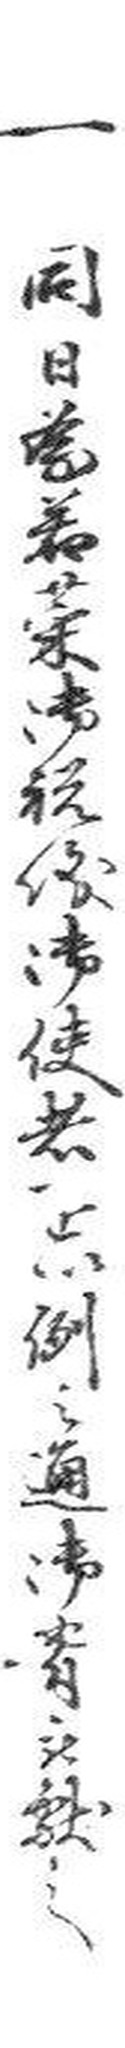一同日為若菜御祝儀御使者を以例之通御肴被献之
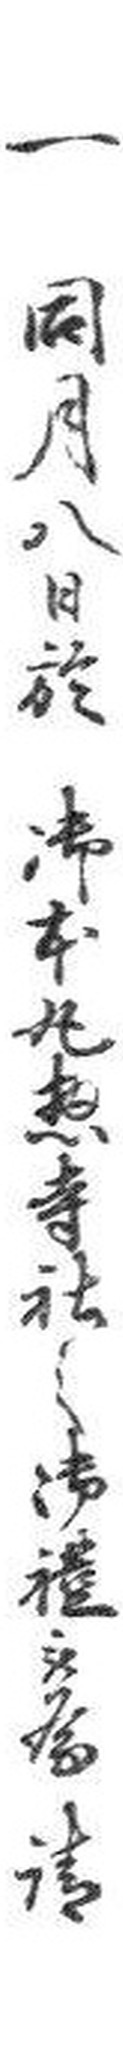一同月八日於御本丸惣寺社之御礼被為請
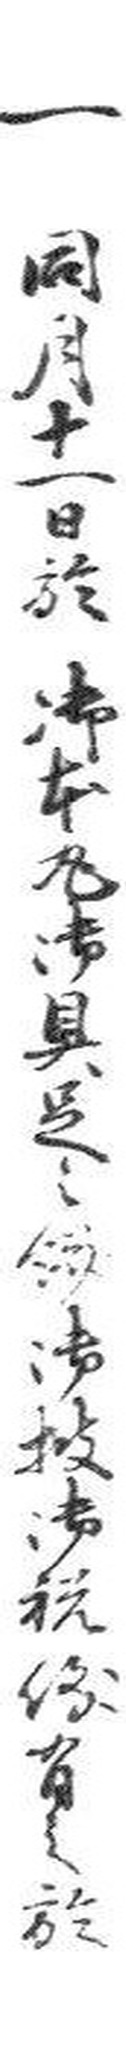一同月十一日於御本丸御具足之餅御披御祝儀有之於
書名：家譜 二十九 吉邦公 従正徳二年到正徳三年
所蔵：福井県文書館 Fukui Prefectural Archives
